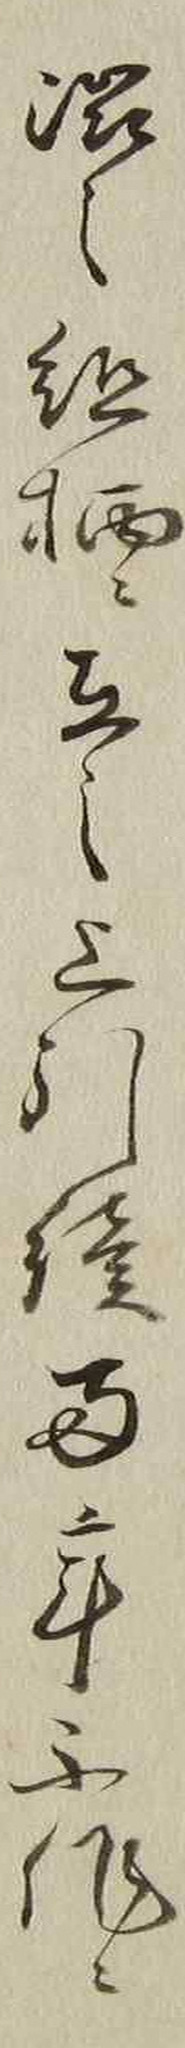渋之組柄ニ在之上引続両年不作ニ
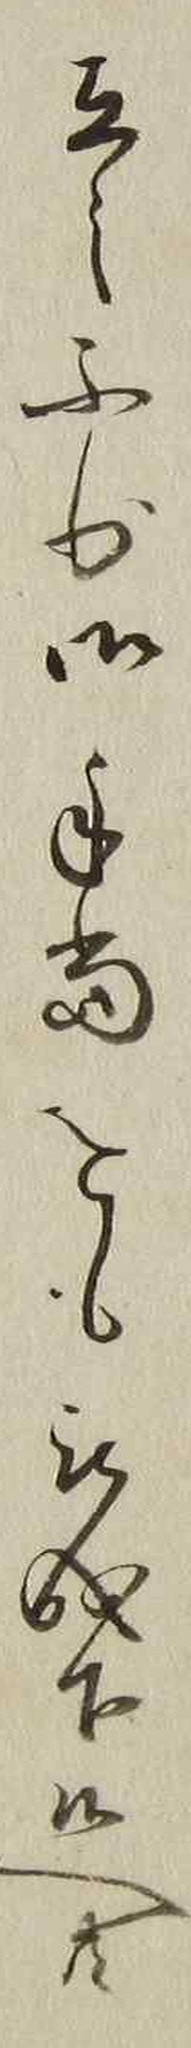在之不少御手当をも被成下候へ共
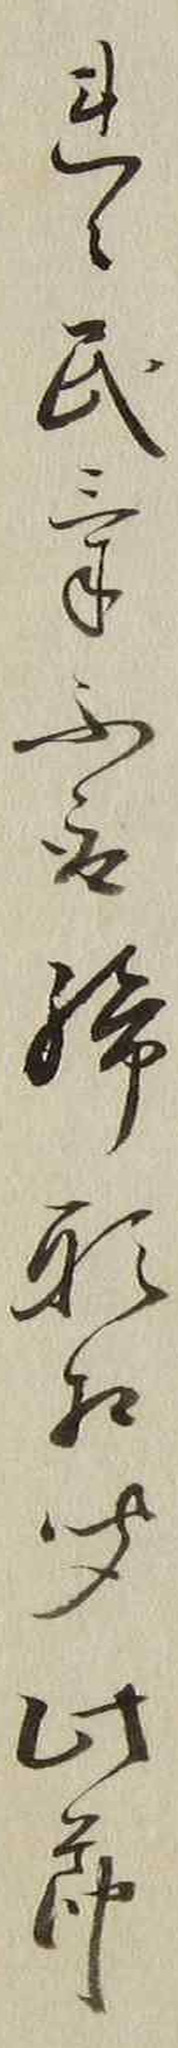連々民気不取締形相聞此節
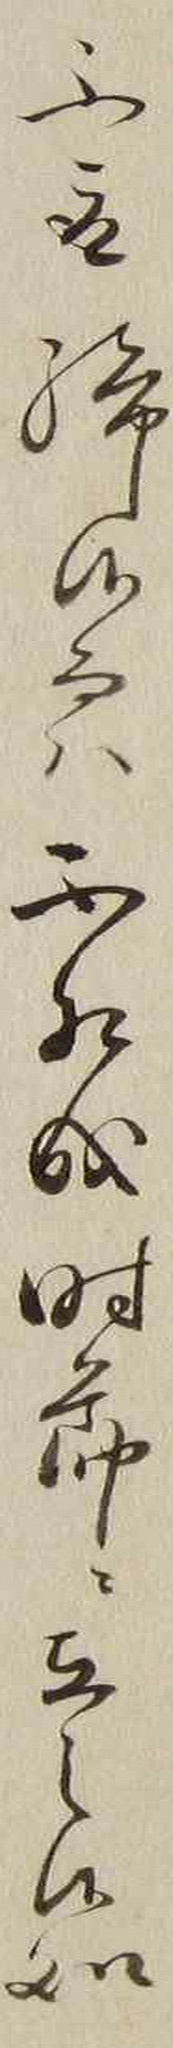不取締候而ハ不相成時節ニ在之候処
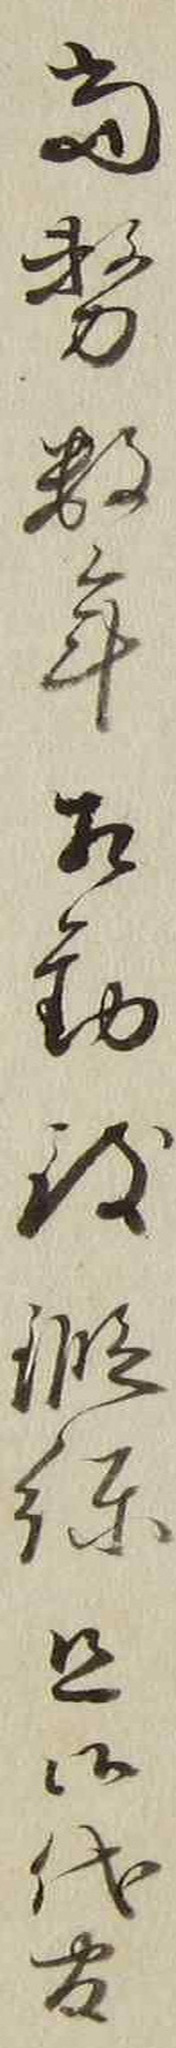当務数年相勤致鍛練且御代官
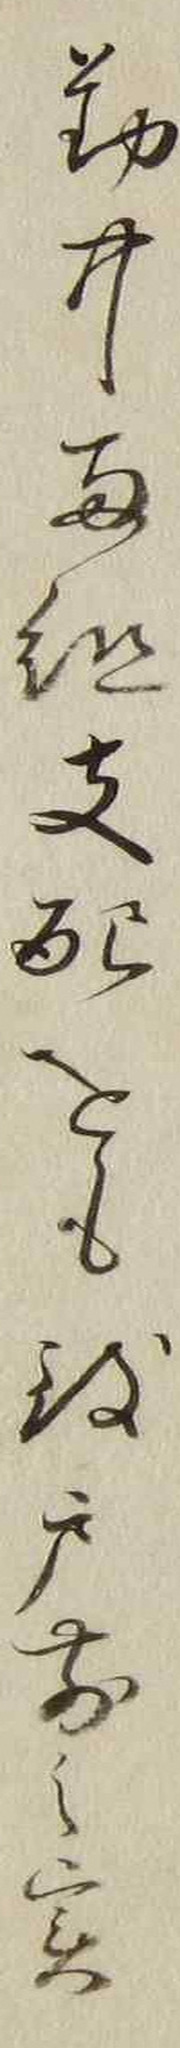勤中両組支配をも致戸前之実
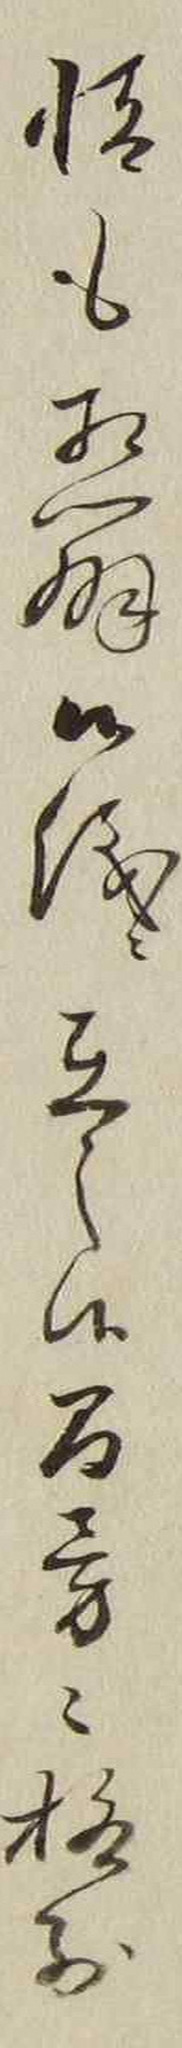情も相弁候儀ニ在之候間旁々格別

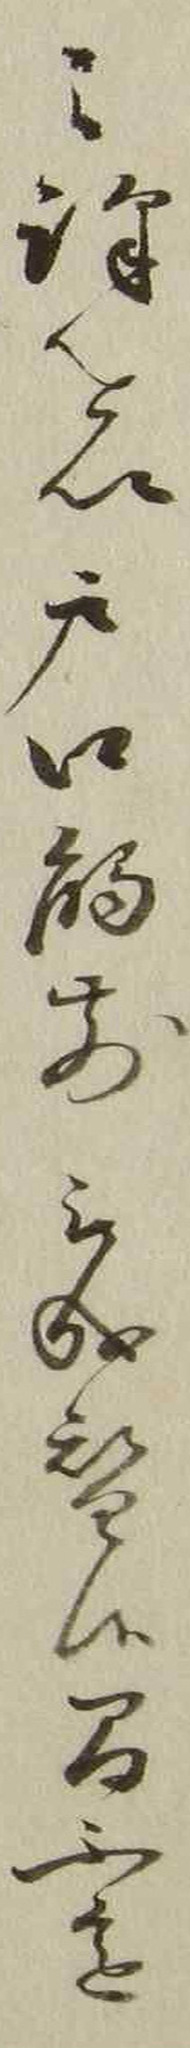之訳を以戸口觸前被成替候間不近
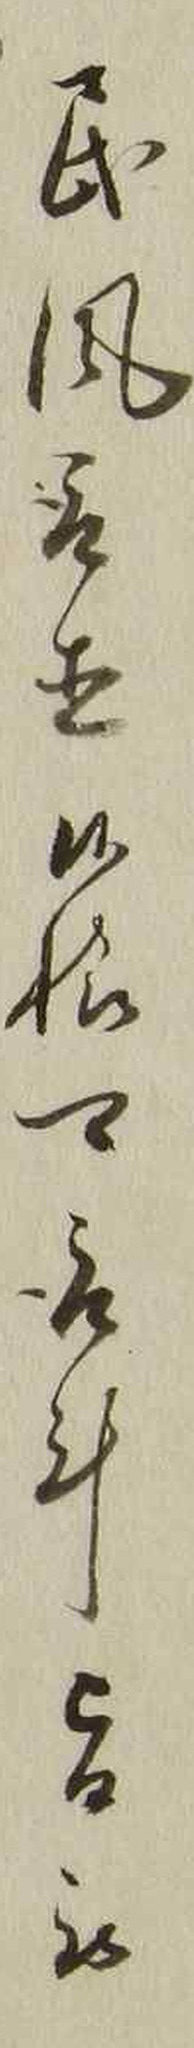民風取直候様可取計旨被
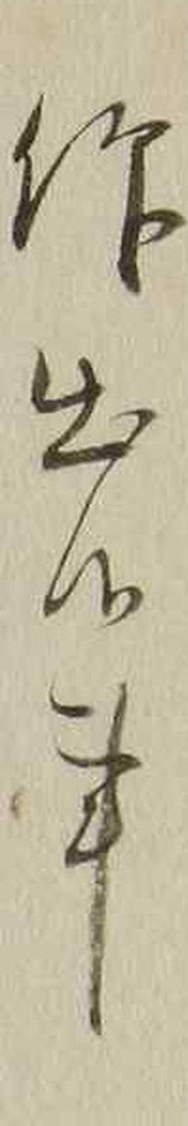仰出候事
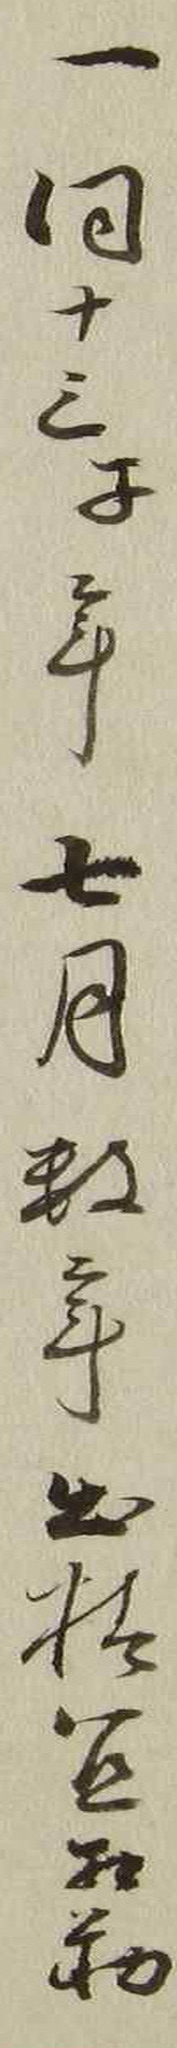一同十三子年七月数年出精宜相勤
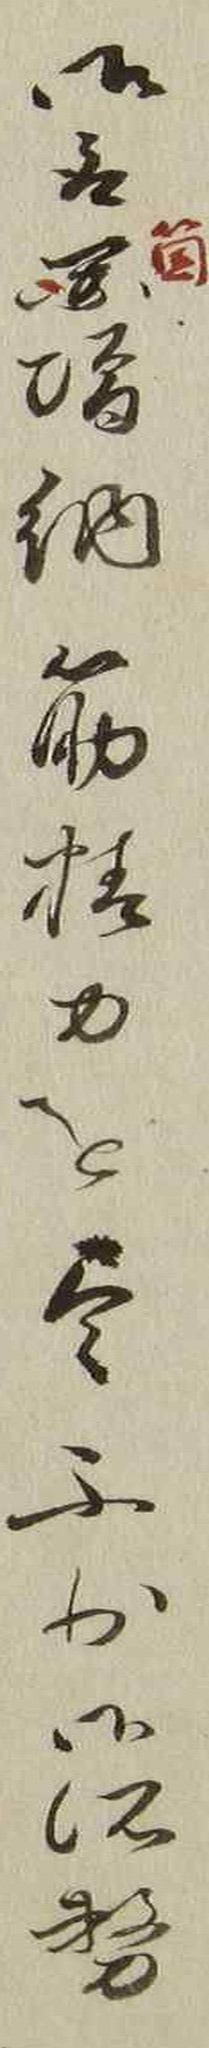御取箇増納筋精力を尽不少御所務
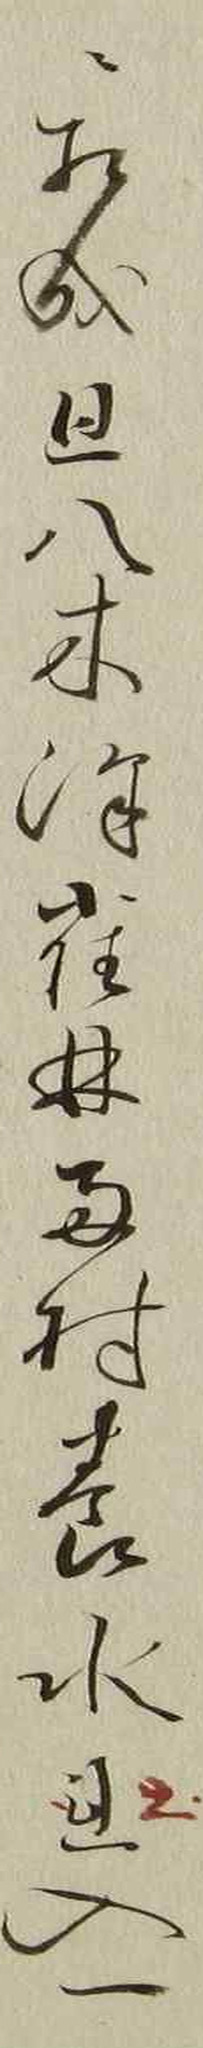ニ相成且八木澤雀林両村養水出入一
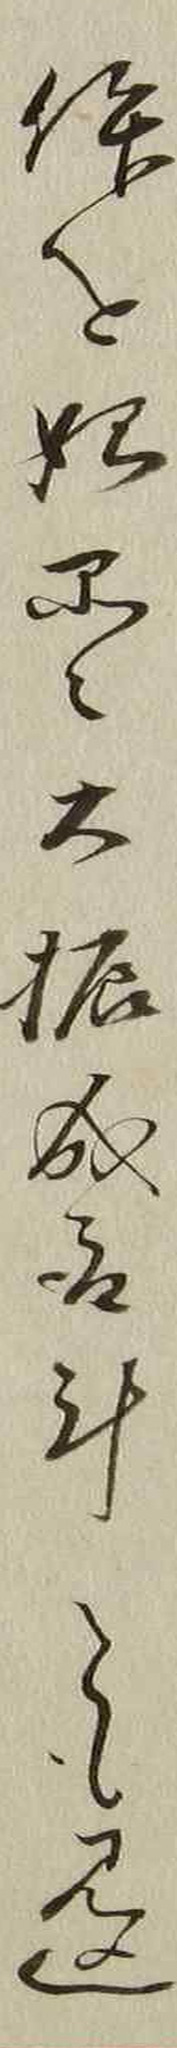信を始品々大振成取計とも見込
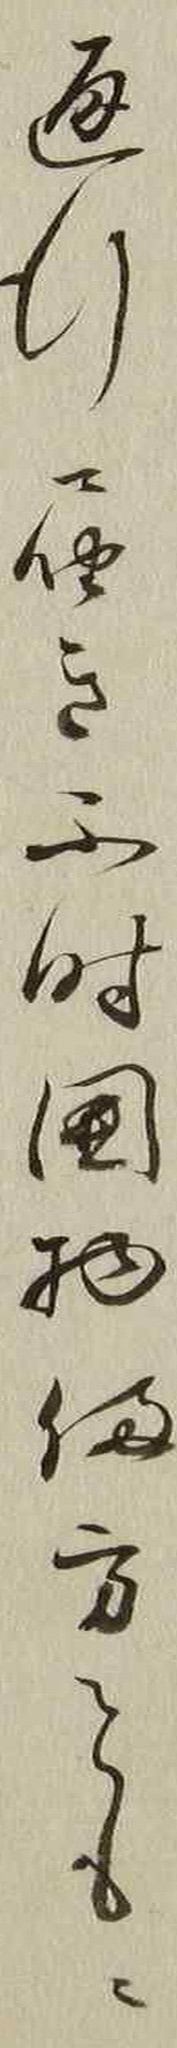通行届き不時囲物備方ともニ
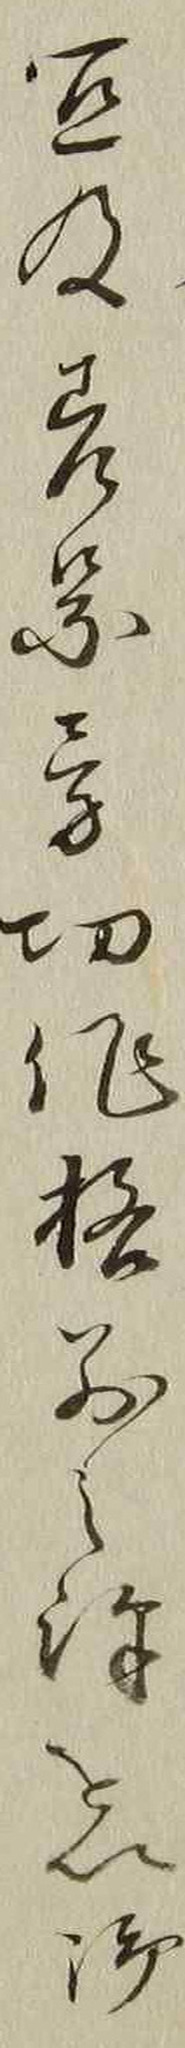宜及差図旁功作格別之訳を以御
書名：諸士系譜　巻之52　に之部3
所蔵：会津若松市立会津図書館
